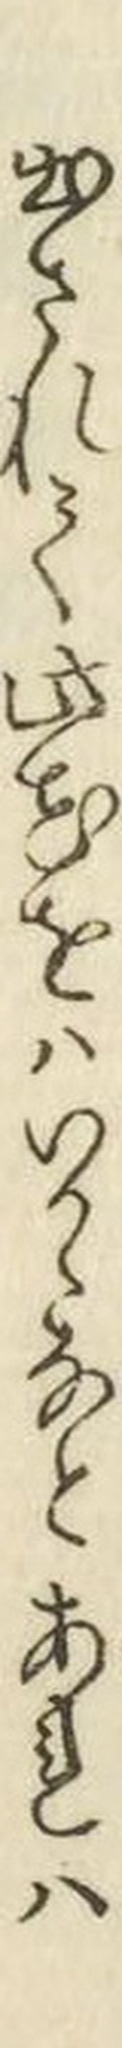出されて此花をはいかゝなとあれは
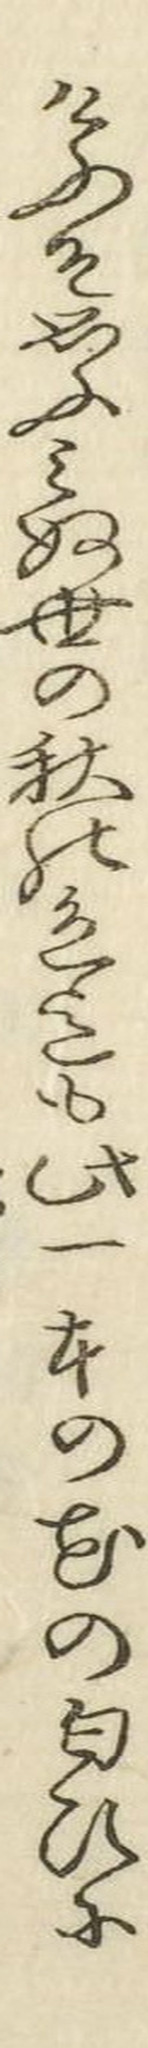けふそ思ふみぬ世の秋の色迄も此一本の花匂ひに宗牧
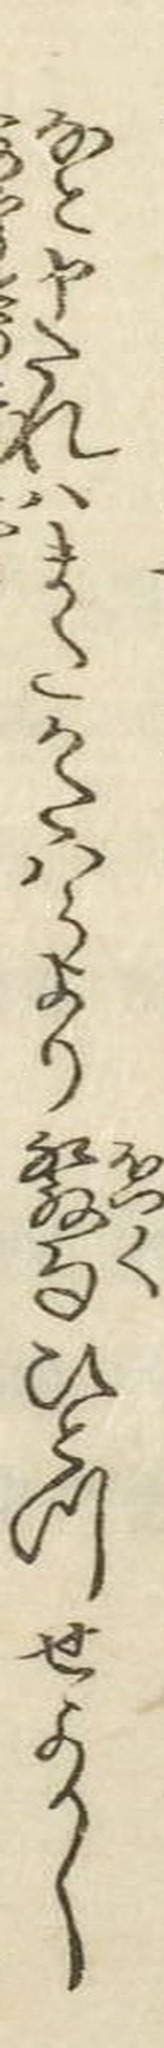なと申たれはまたかたはらより發句ひとつせよかし
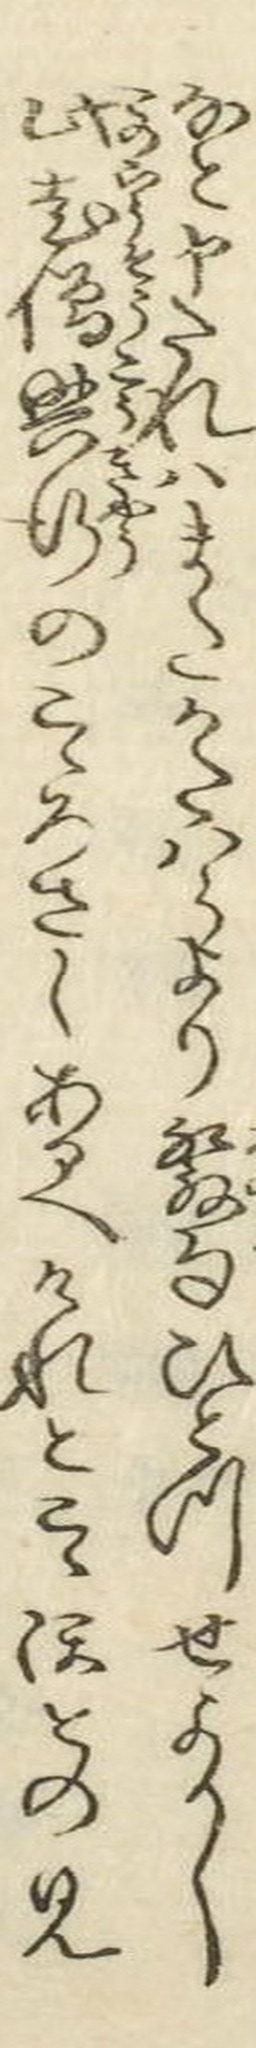此老僧興行のこゝろさしあるへけれとこゝほとの見
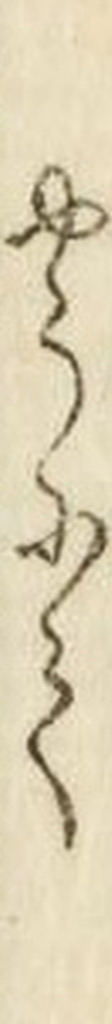やうにて
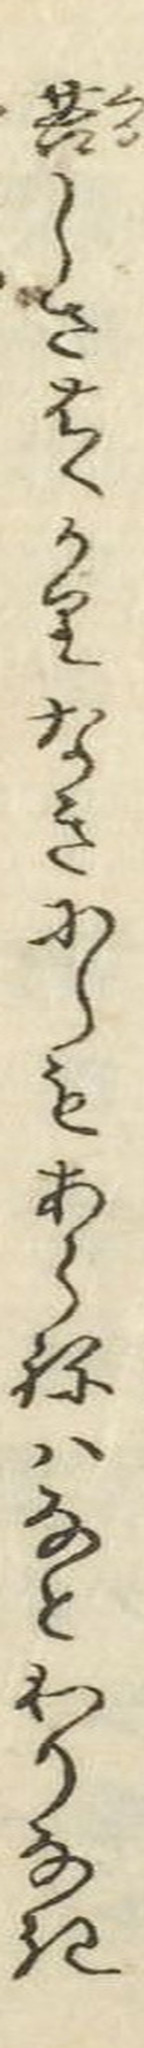苦しさはゝかりなきにしもあらねはなとわりなき
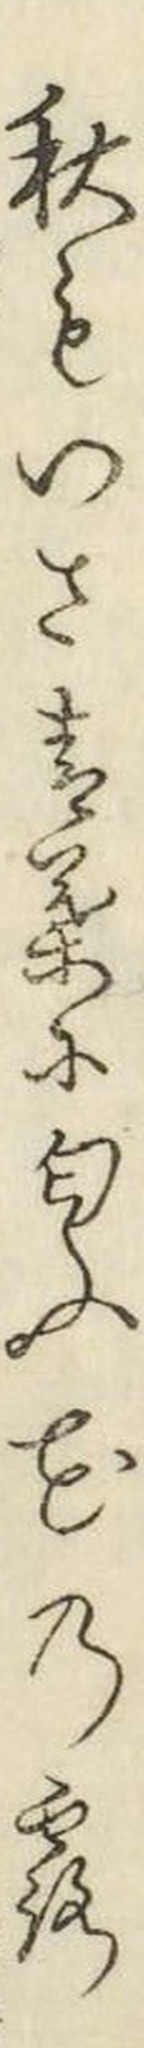秋もいさ青葉に匂ふ花の露仝
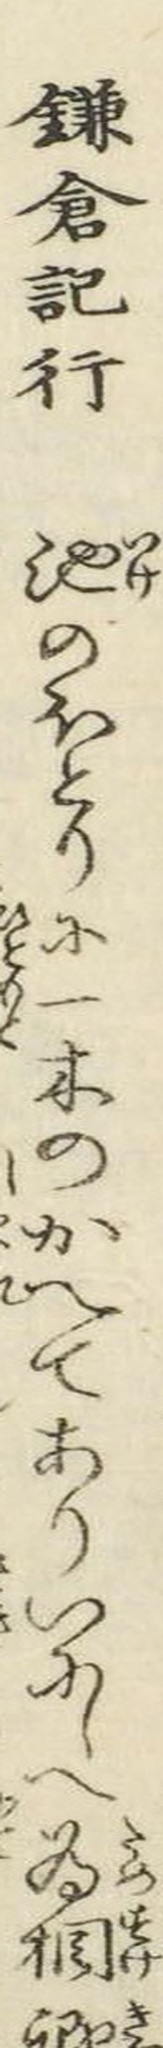鎌倉記行池のほとりに一木のかへてありいにしへ為相卿
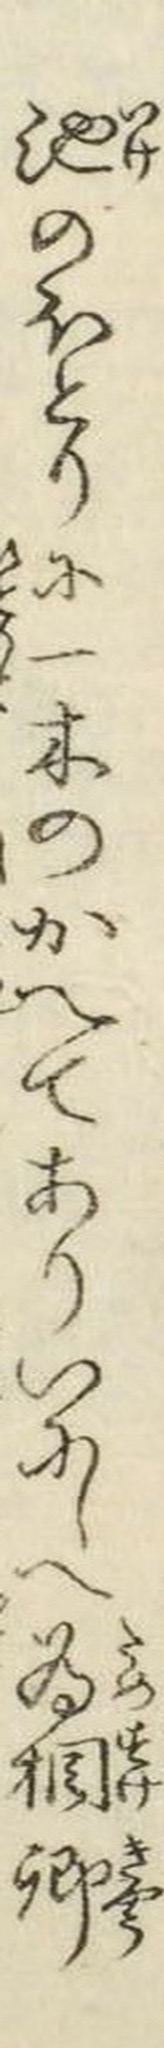鎌倉記行池のほとりに一木のかへてありいにしへ為相卿
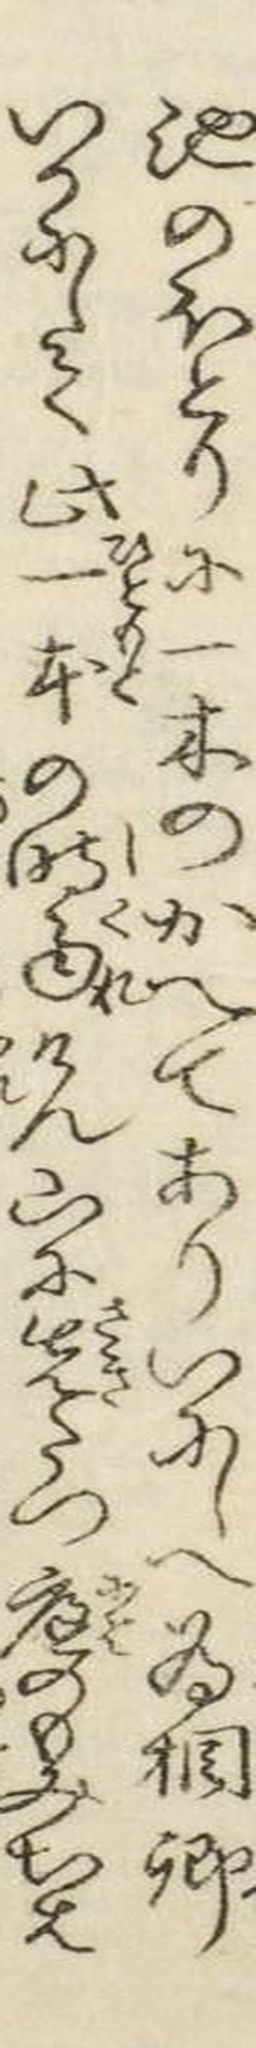いかにして此一本の時雨けん山に先たつ庭のもみちは
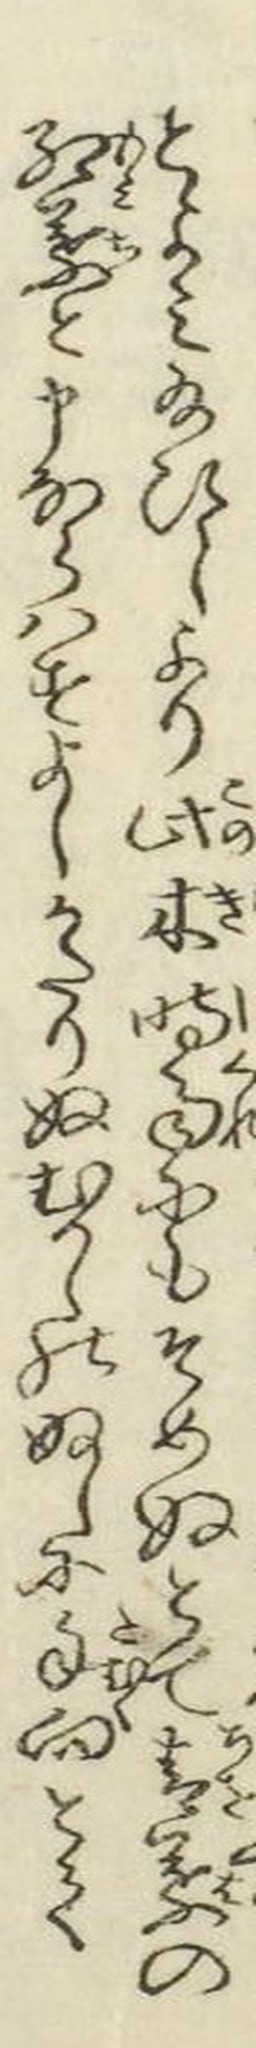紅葉と申ならはすよしかたりぬむかしのぬしに手向とて
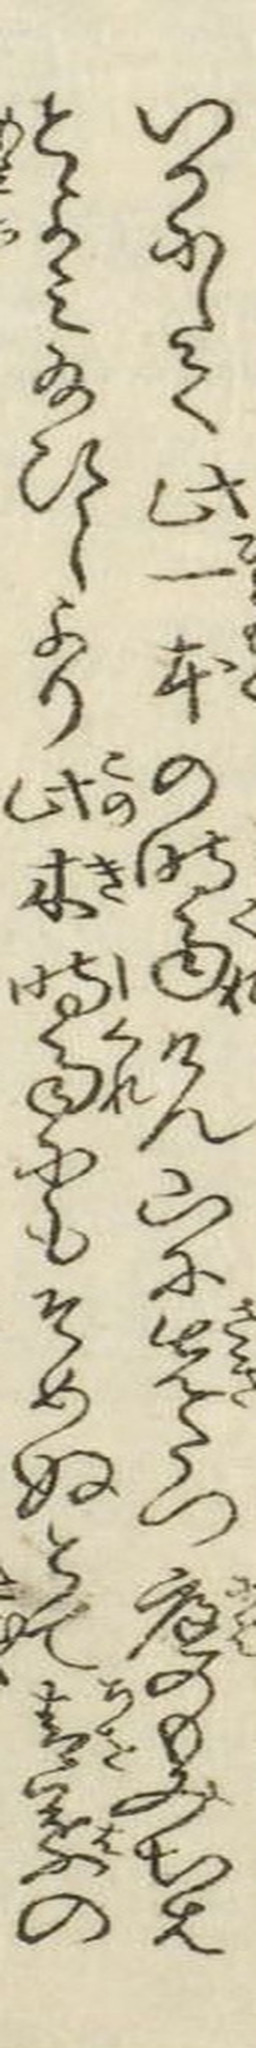をよみ給うひしより此木時雨にもそめぬとて青葉の
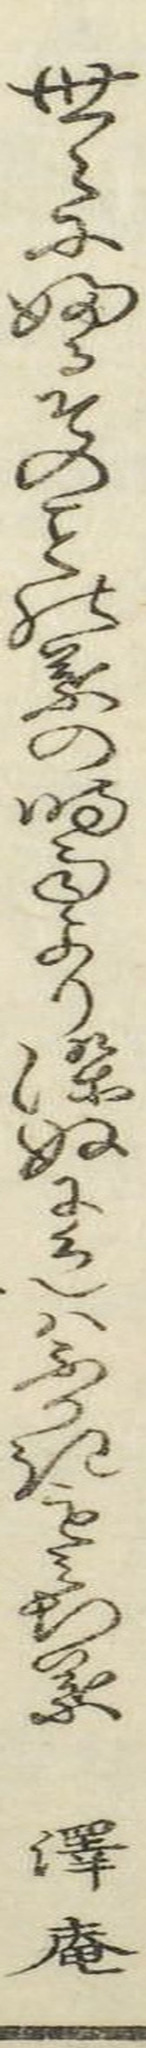世々にふるそのことの葉の時雨より染ぬに色はふかきもみち葉澤庵
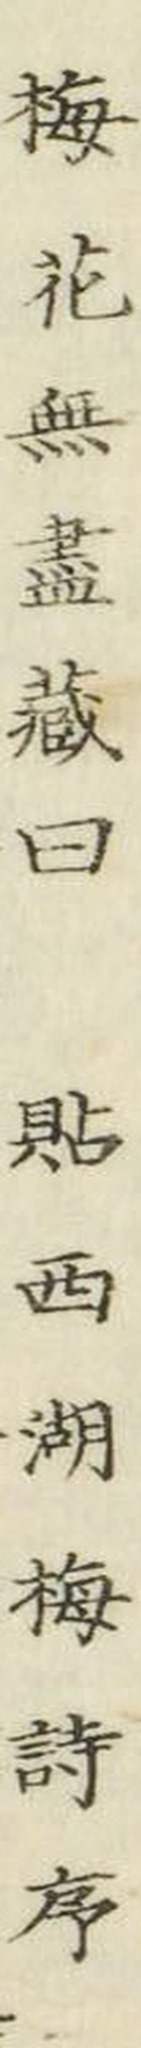梅花無盡藏曰貼西湖梅詩序
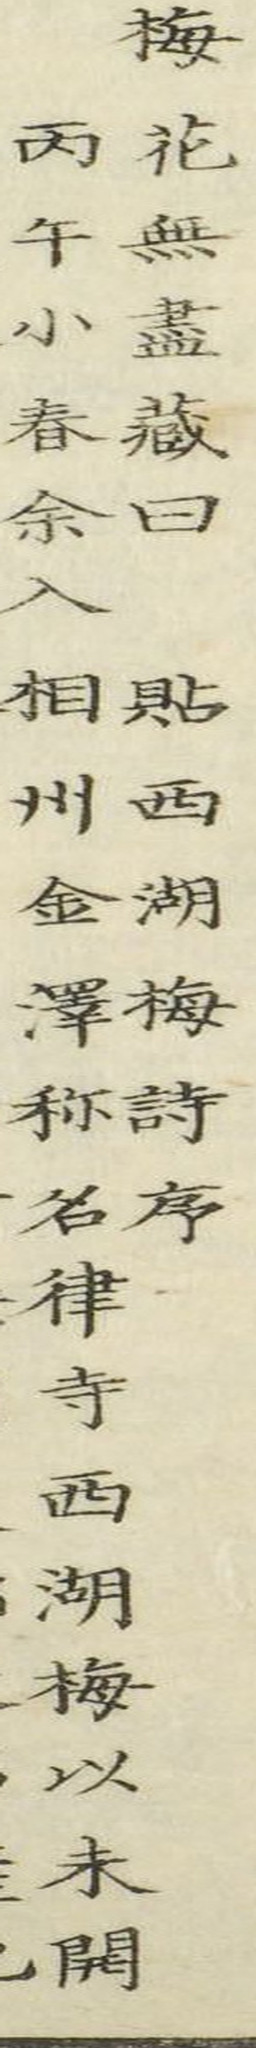丙午小春余入相州金澤称名律寺西湖梅以未開
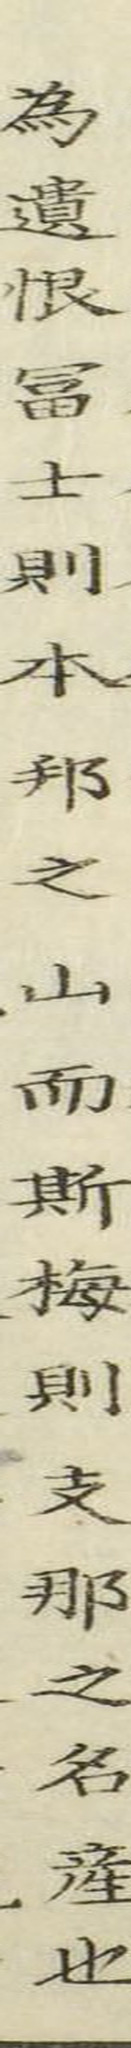為遺恨冨士則本邦之山而斯梅則支那之名産也
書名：江戸名所図会 20巻 巻之6
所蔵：東京学芸大学教育コンテンツアーカイブ
